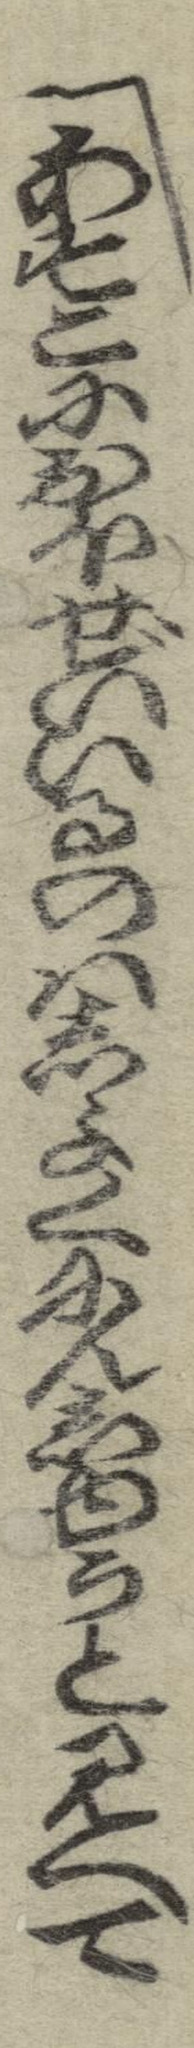〽あそこにおほぜいいるのはしよくにんしゆうと見へて
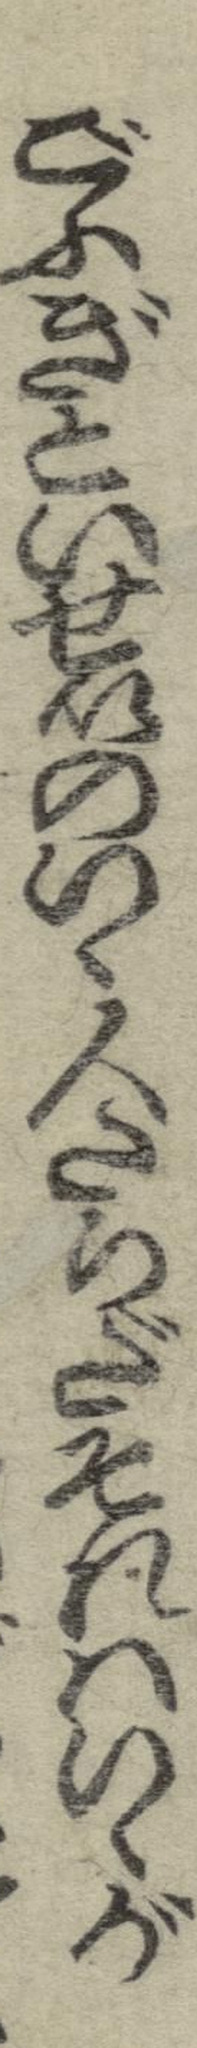ごふぎといせいのいゝ人たちだそれはいゝが
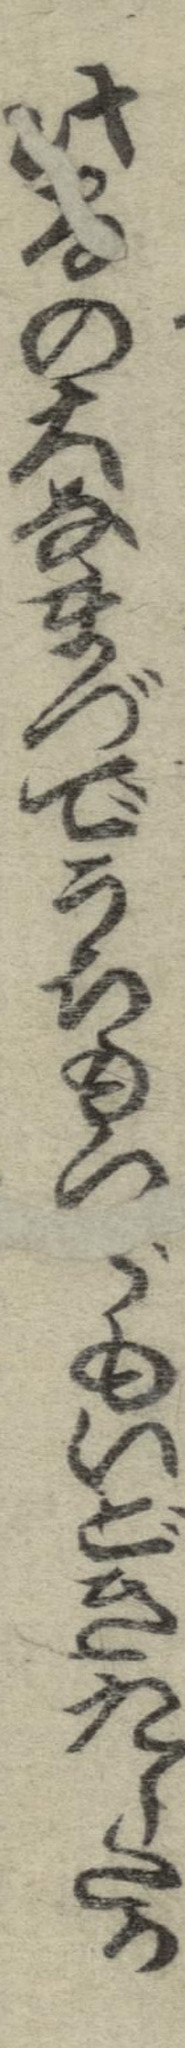此間の大なまづでうちもくらもいごきたしたか
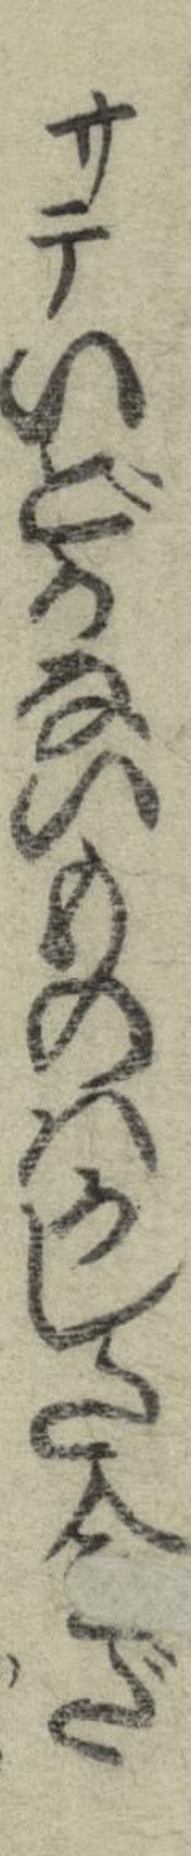サテいごかないものはかした金だ
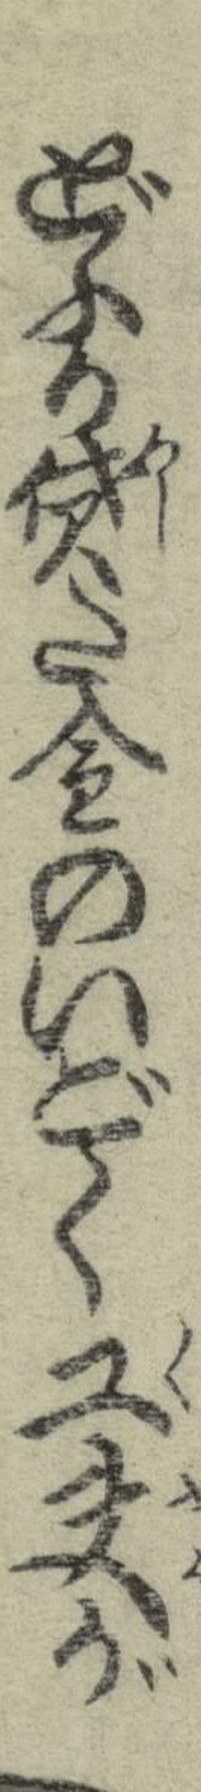どふか貸た金のいごく工夫が
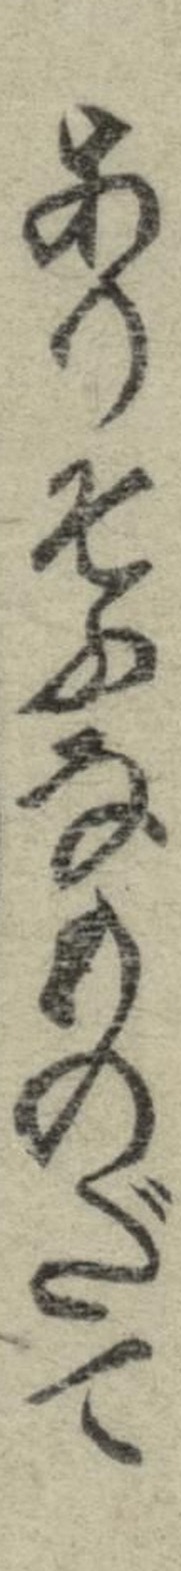ありそふなものだて
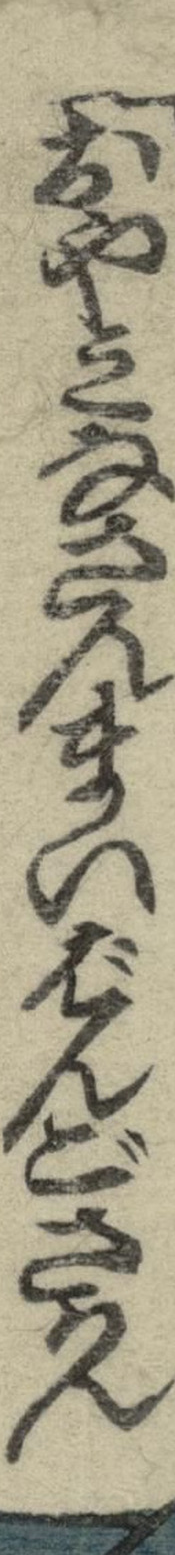〽おやみなさんまいばんごさかん
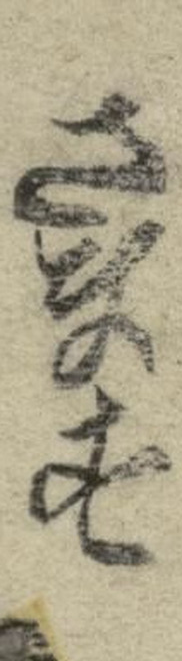さます
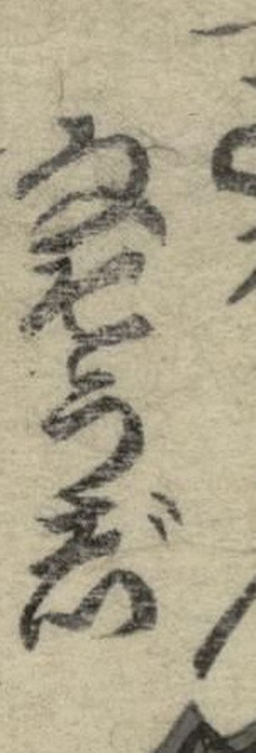なそうじ
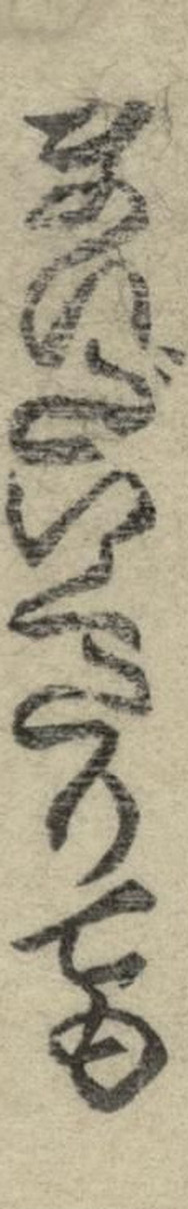まいだいくたりても
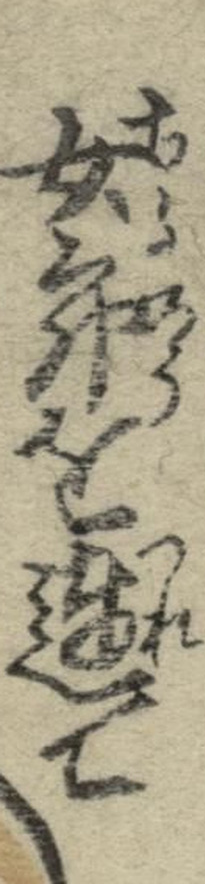女郎を連て
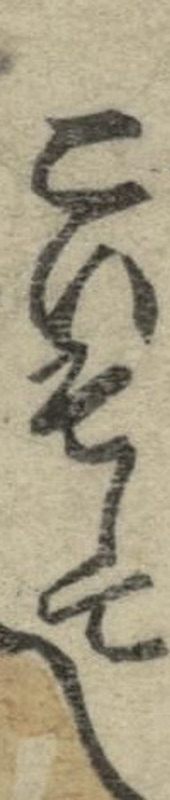こいそして
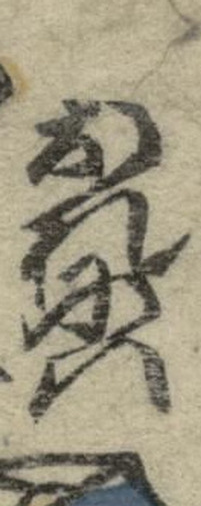おれには
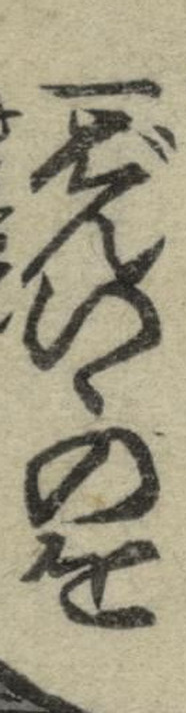一ばんいゝのを
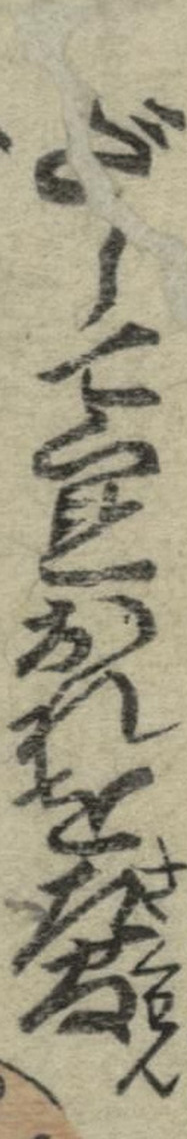だしてくれおれを左官
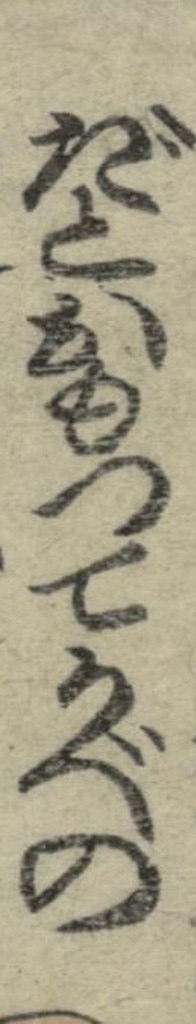だとおもつてかべの
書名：瓢箪
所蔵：東京大学地震研究所図書室 Earthquake Research Institute Library, The University of Tokyo, JAPAN
